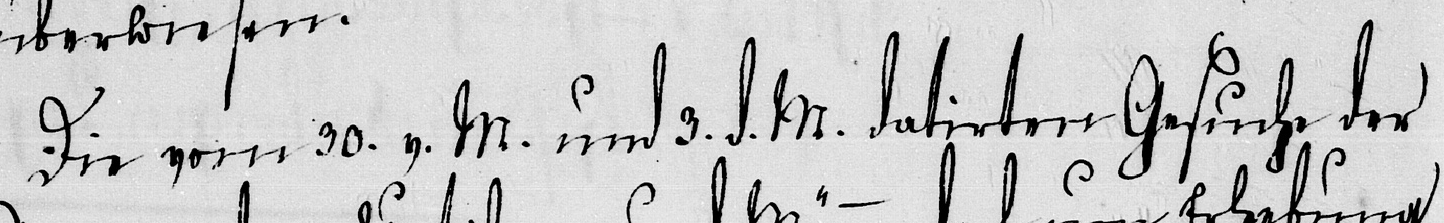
Die vom 30. v. M. und 3. d. M. datirten Gesuche der
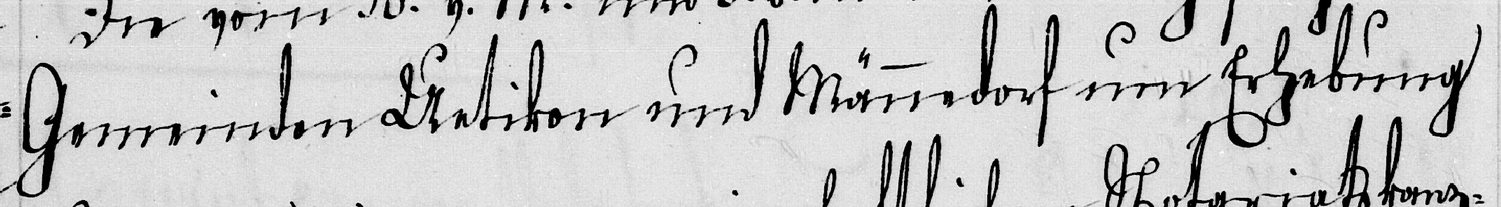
Gemeinden Uetikon und Männedorf um Erhebung
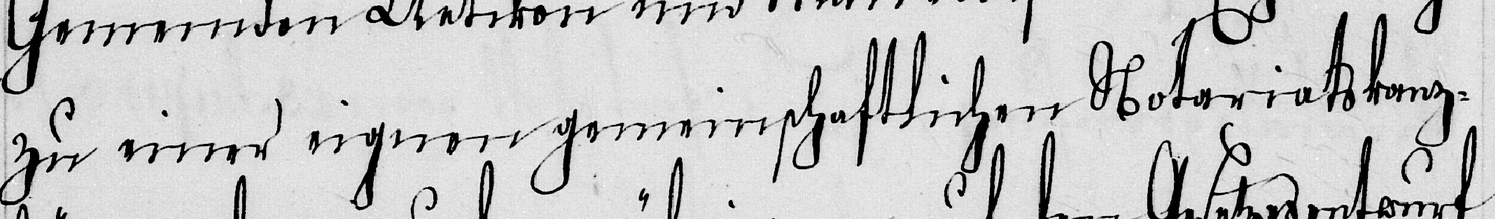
zu einer eigenen gemeinschaftlichen Notariatskanz¬
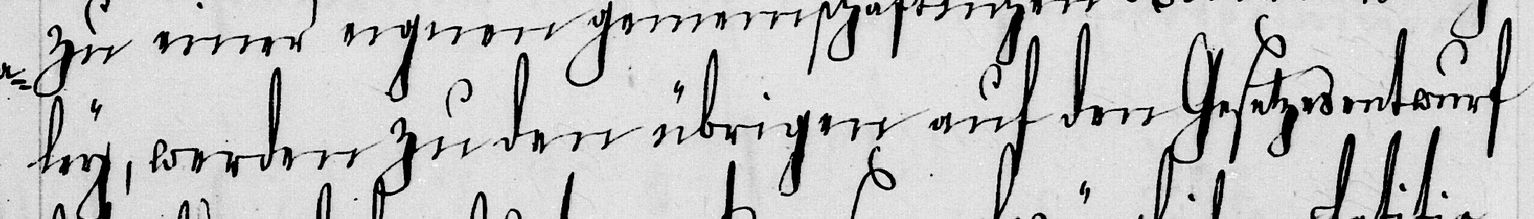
ley, werden zu den übrigen auf den Gesetzesentwurf
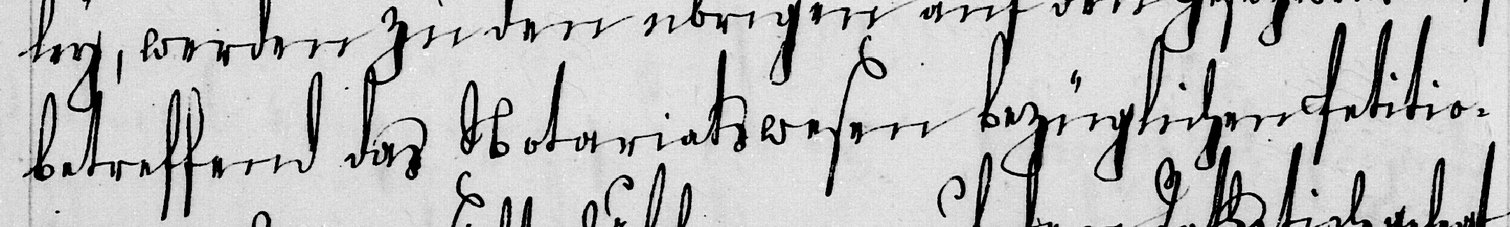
betreffend das Notariatswesen bezüglichen Petitio¬
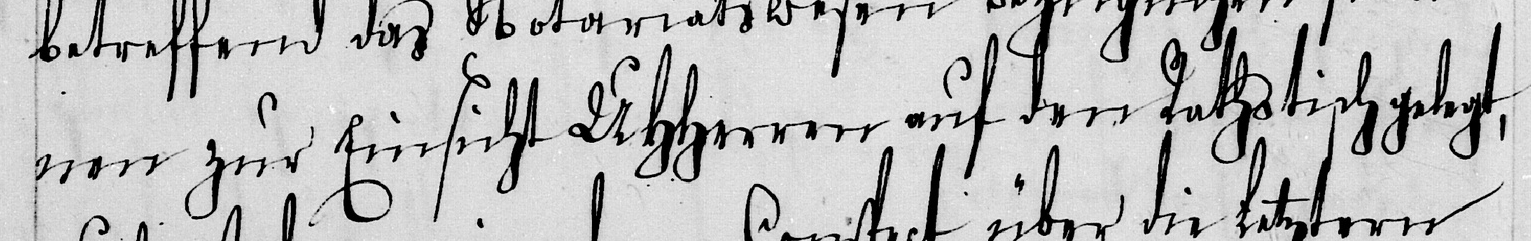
nen zur Einsicht UHHerren auf den Rathstisch gel¬
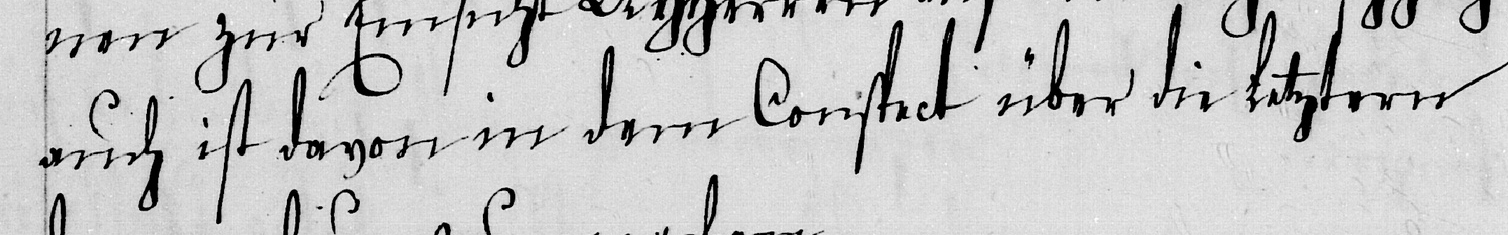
auch ist davon in dem Conspect über die Letztern
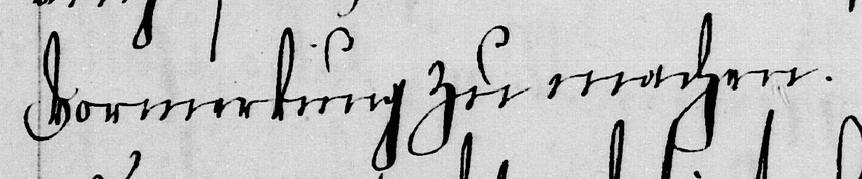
Vormerkung zu machen.
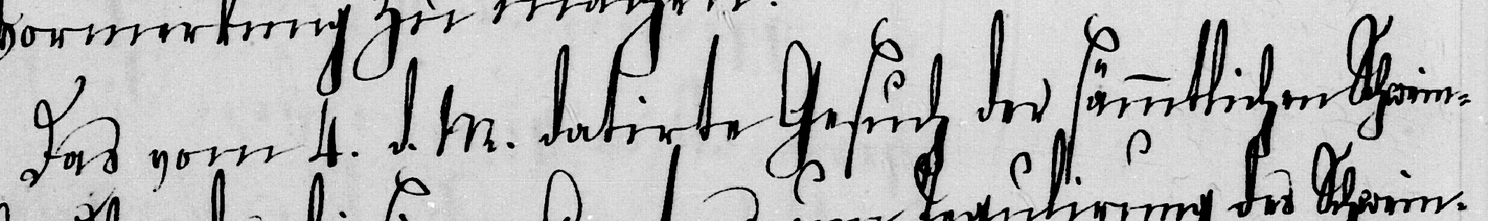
Das vom 4. d. M. datirte Gesuch der sämmtlichen Sch¬
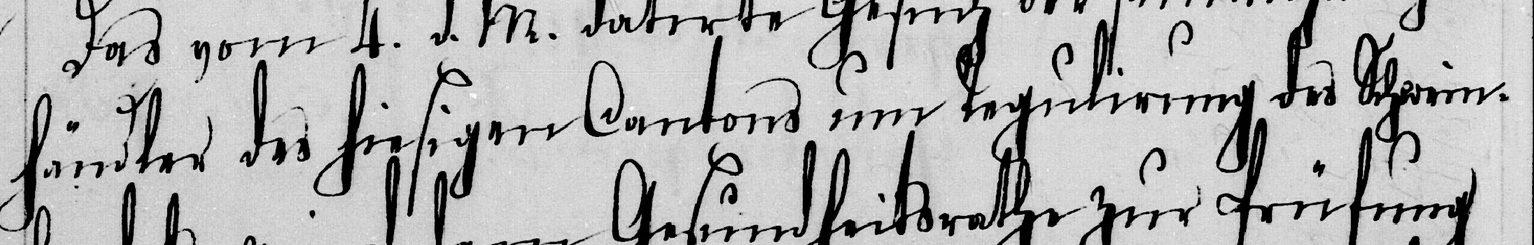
händler des hiesigen Cantons um Regulierung des Schwei¬
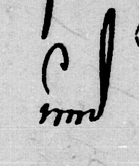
und
